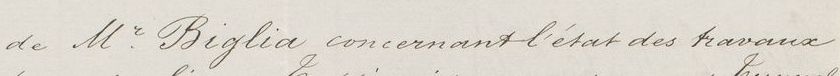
de MrBiglia concernant l'état des travaux
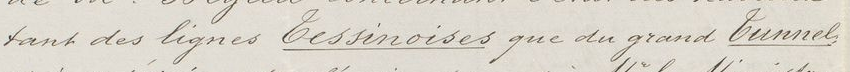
tant des lignes Tessinoises que du grand Tunnel,
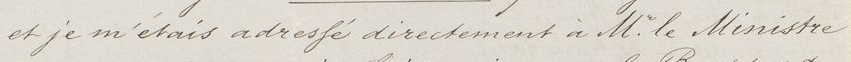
et je m'étais adressé directement à Mrle Ministre
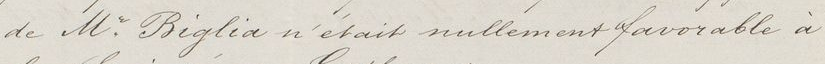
de MrBiglia n'était nullement favorable à
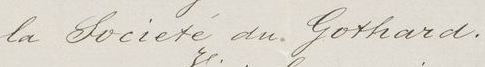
la Société du Gothard.
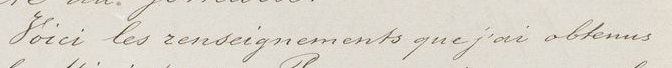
Voici les renseignements que j'ai obtenus
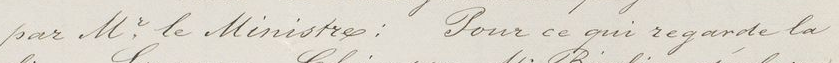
par Mrle Ministre: Pour ce qui regarde la
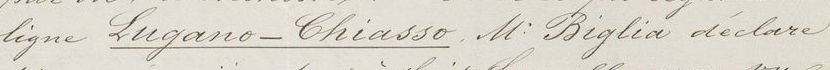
ligne Lugano–Chiasso. MrBiglia déclare
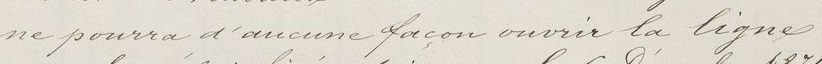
ne pourra d'aucune façon ouvrir la ligne
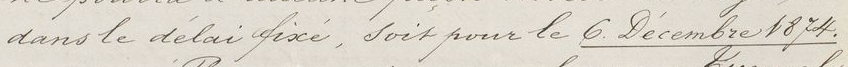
dans le délai fixé, soit pour le 6. Décembre 1874.
